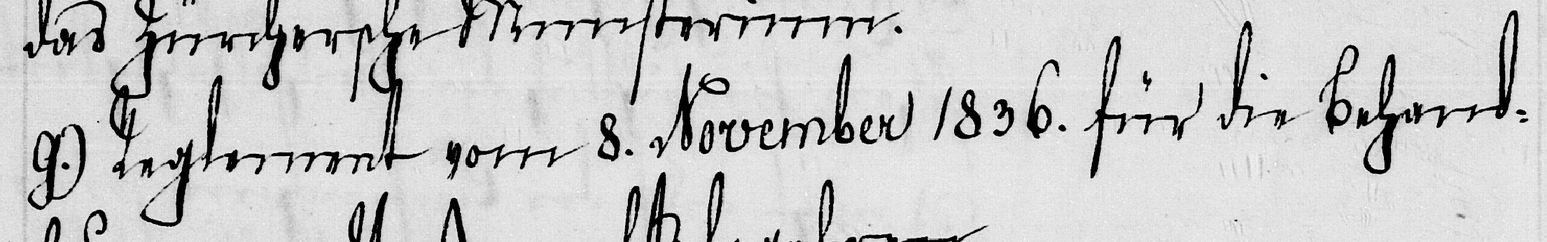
g.) Reglement vom 8. November 1836. für die Behand¬
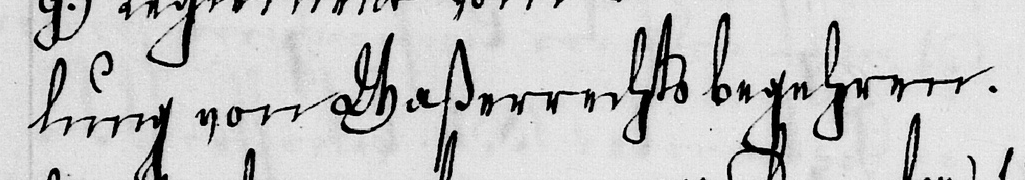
lung von Waßerrechtsbegehren.
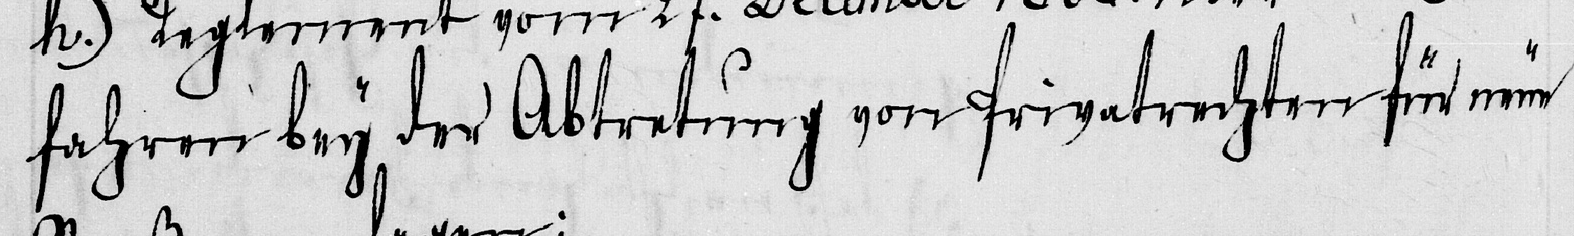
fahren bey der Abtretung von Privatrechten für neue
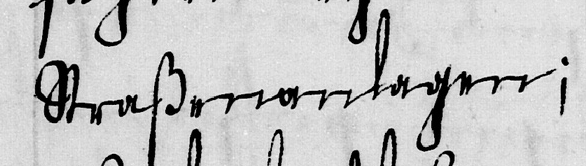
Straßenanlagen;
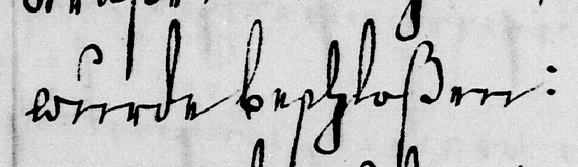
wurde beschloßen:
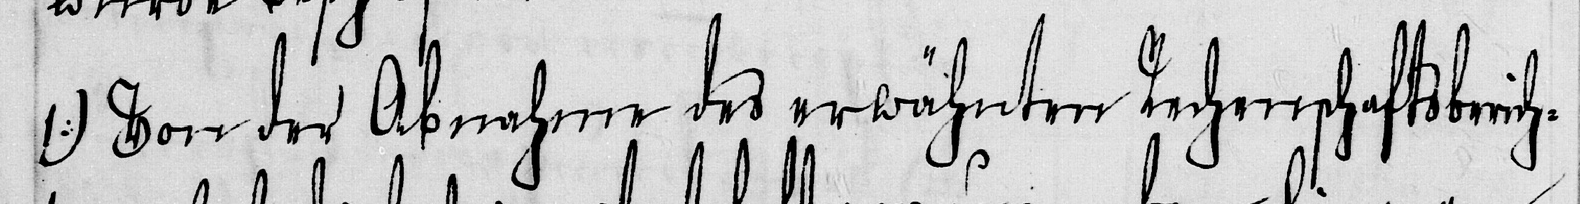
1.) Von der Abnahme des erwähnten Rechenschaftsberic¬
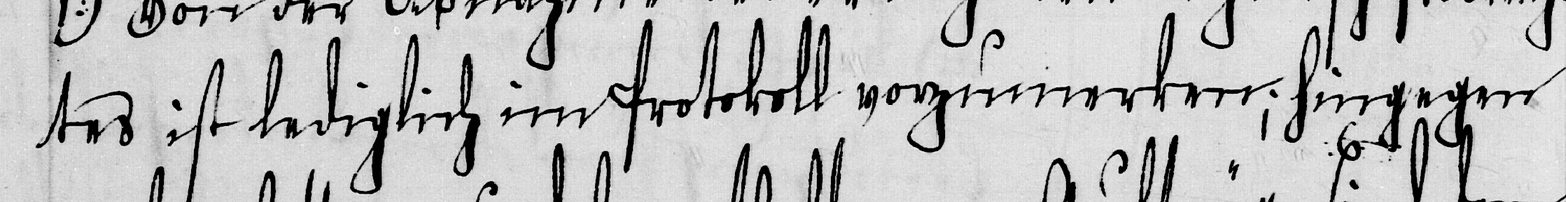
htes ist lediglich im Protokoll vorzumerken; hingegen
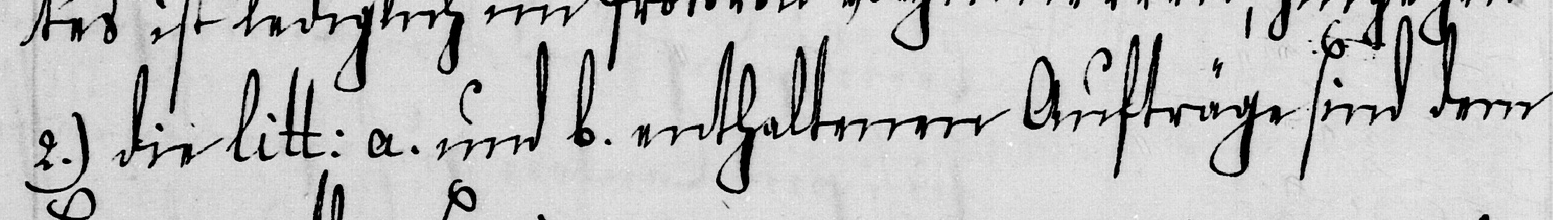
a. und b. enthaltenen Aufträge sind dem
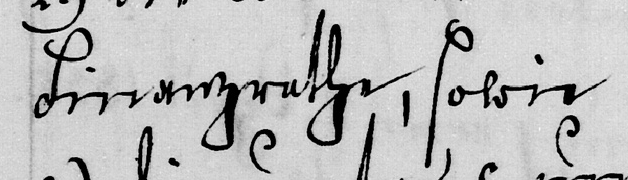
Finanzrathe, sowie
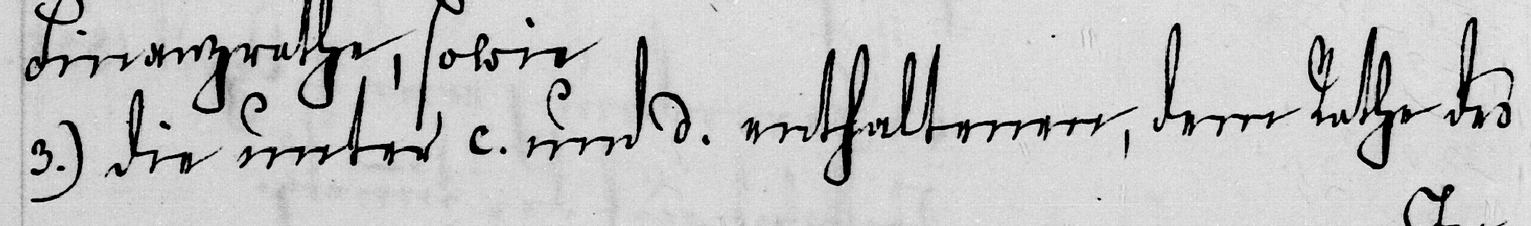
3.) die unter c. und d. enthaltenen, dem Rathe des
